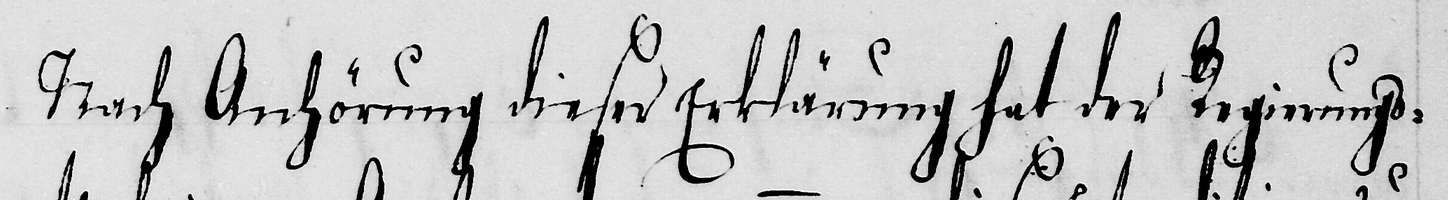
Nach Anhörung dieser Erklärung hat der Regierung¬
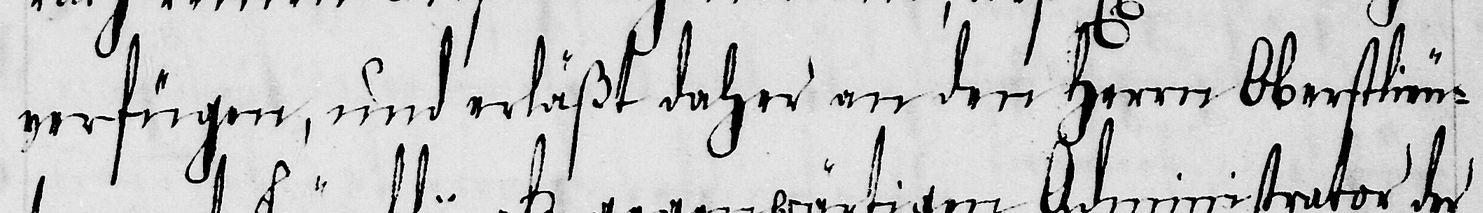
verfügen, und erläßt daher an den Herrn Oberstlieu¬
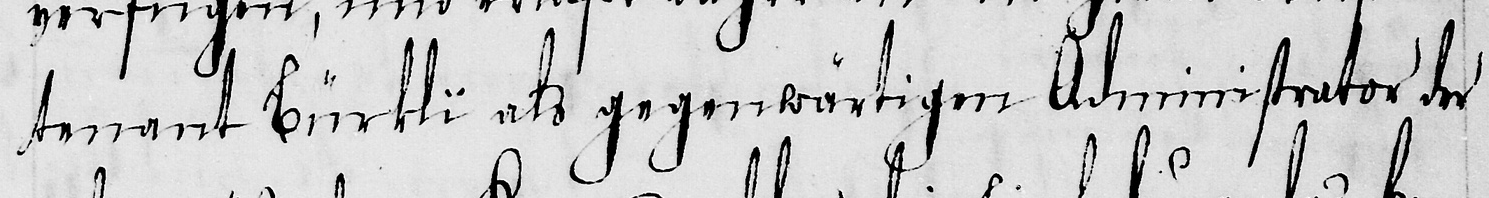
tenant Bürkli als gegenwärtigen Administrator der
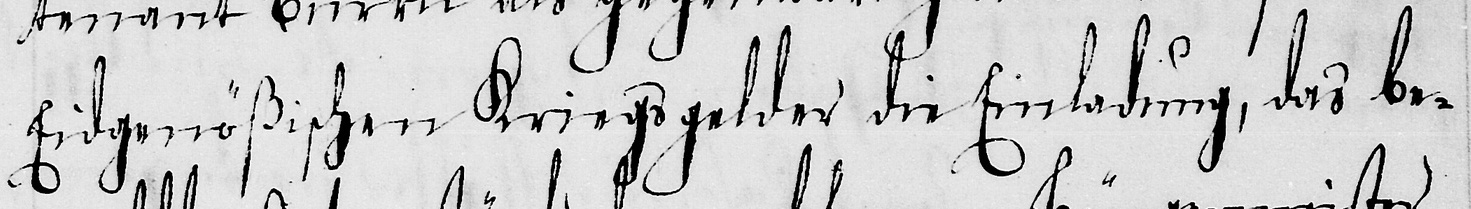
Eidgenößischen Kriegsgelder die Einladung, das be¬
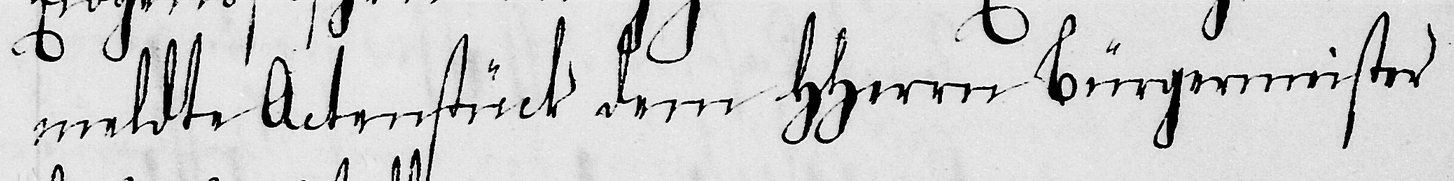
meldte Actenstück dem HHerrn Bürgermeister
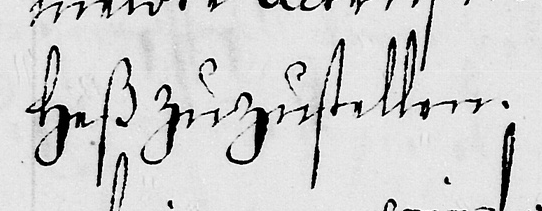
Heß zuzustellen.
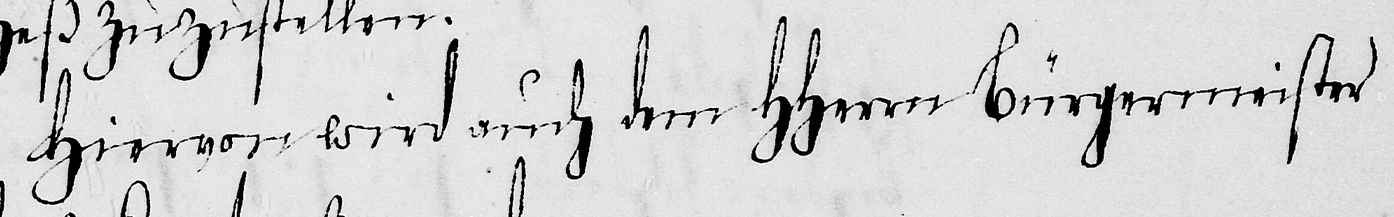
Hiervon wird auch dem HHerrn Bürgermeister
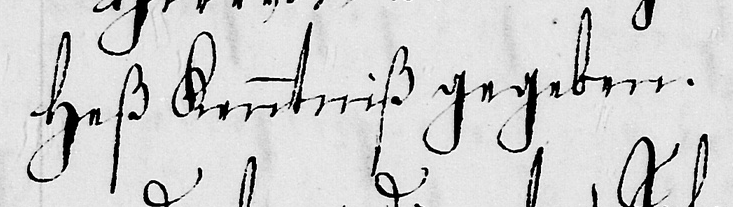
Heß Kenntniß gegeben.
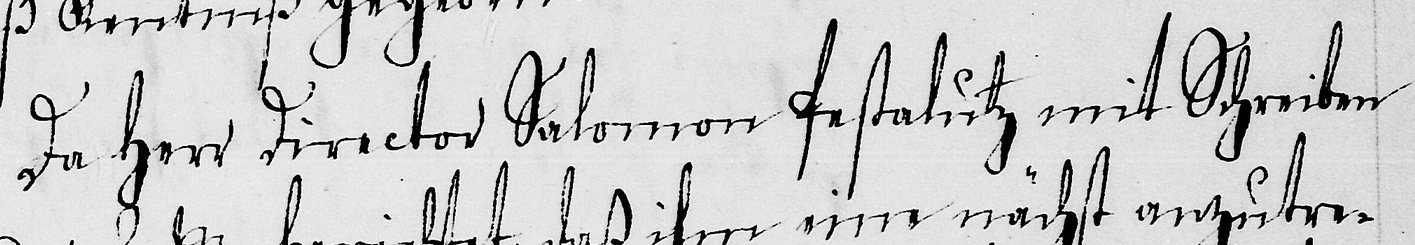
Da Herr Director Salomon Pestaluz mit Schreiben
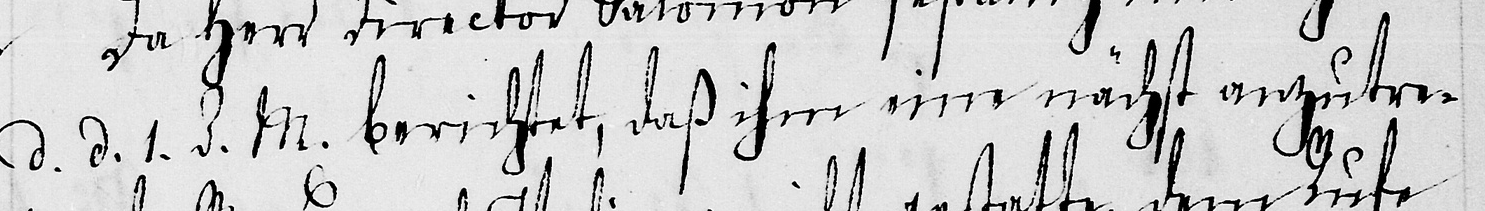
d. d. 1. d. M. berichtet, daß ihm eine nächst anzutre¬
